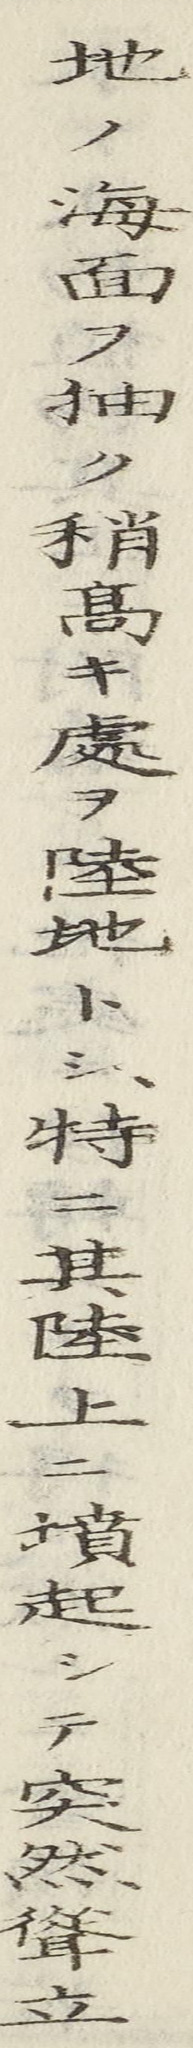地ノ海面ヲ抽ク稍高キ処ヲ陸地トシ、特ニ其陸上ニ墳起シテ突然聳立
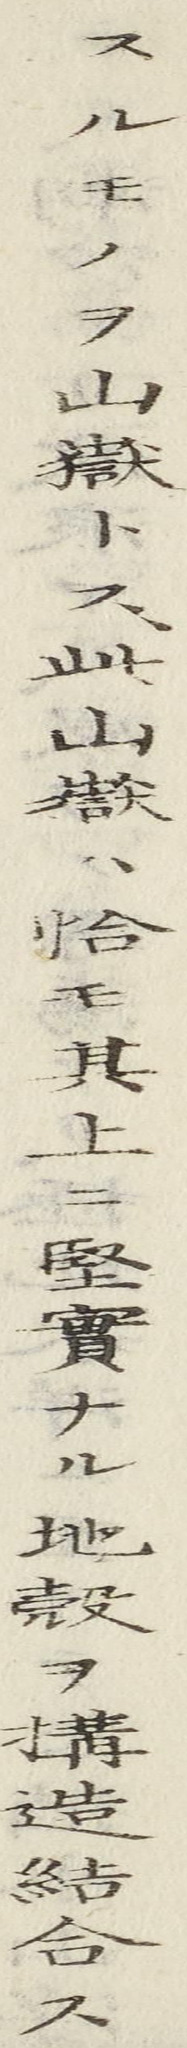スルモノヲ山嶽トス、此山嶽ハ恰モ其上ニ堅実ナル地殻ヲ構造結合ス
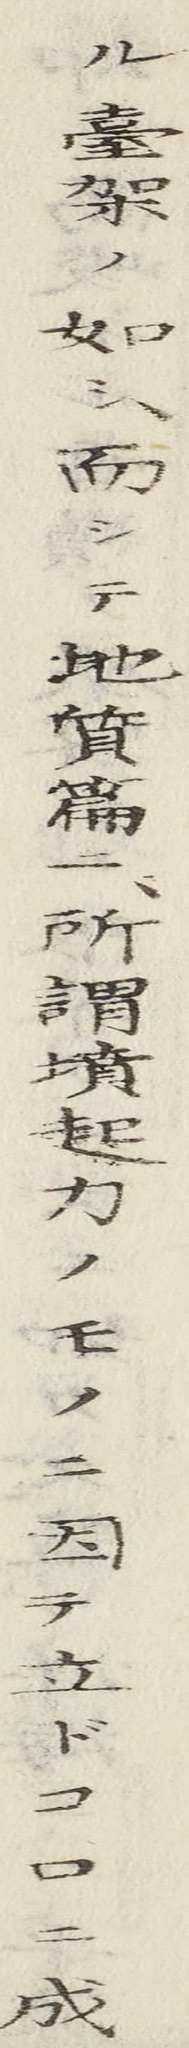ル台架ノ如シ、而シテ地質篇ニ、所謂墳起力ノモノニ因テ立ドコロニ成
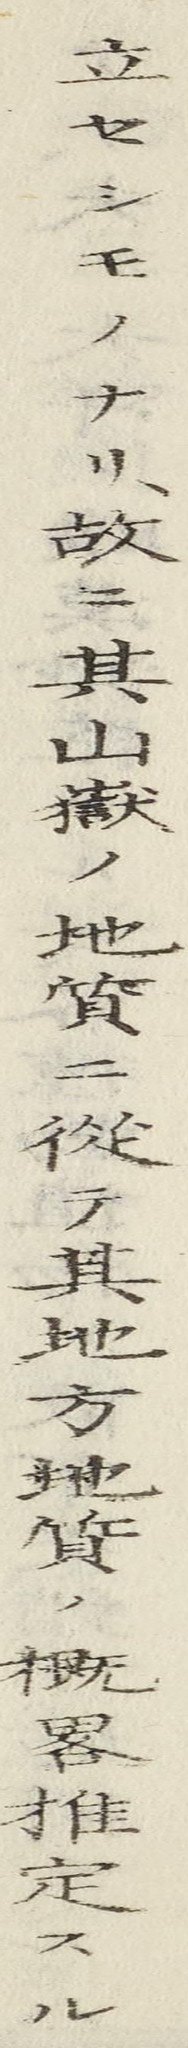立セシモノナリ、故ニ其山嶽ノ地質ニ従テ其地方地質ノ概略推定スル
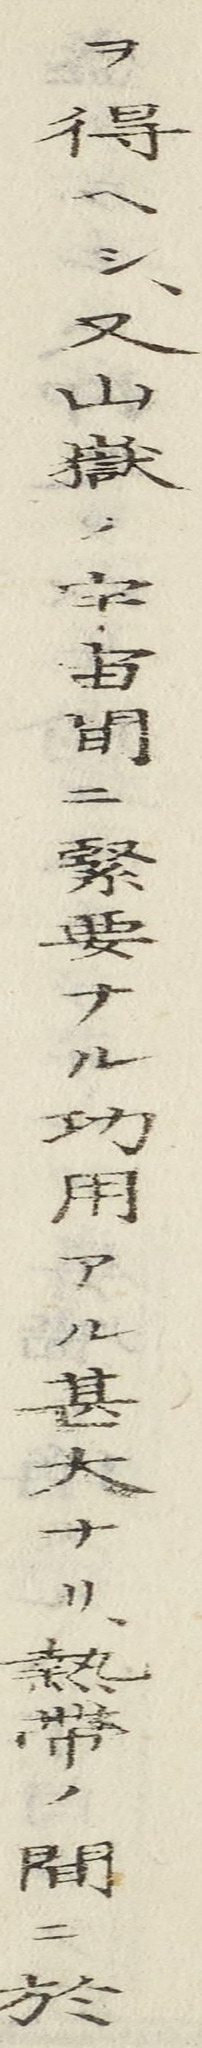ヲ得ヘシ、又山嶽ノ宇宙間ニ緊要ナル功用アル甚大ナリ、熱帯ノ間ニ於
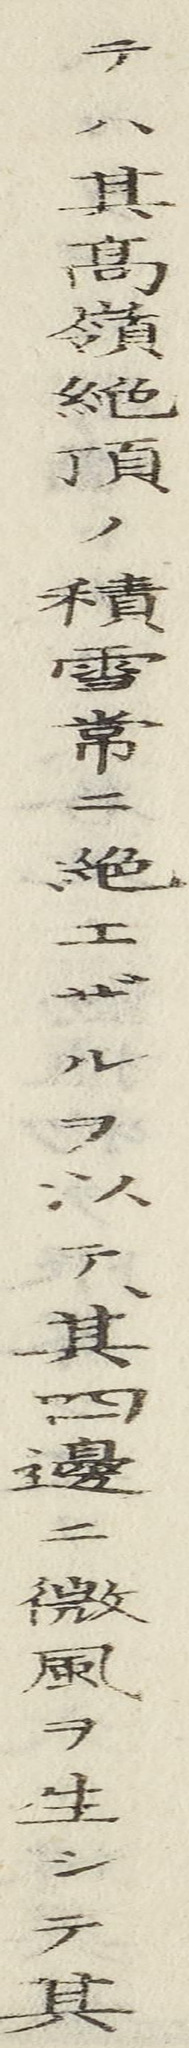テハ其高嶺絶頂ノ積雪常ニ絶エザルヲ以テ、其四辺ニ微風ヲ生シテ其
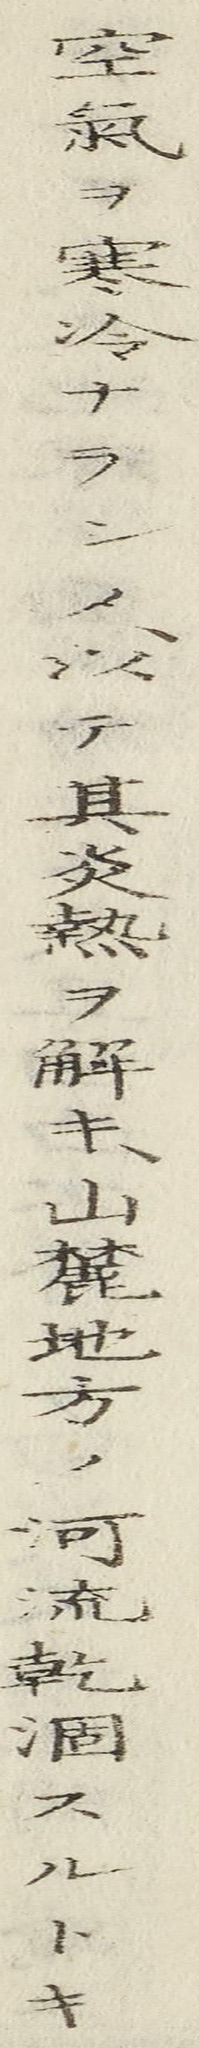空気ヲ寒冷ナラシメ、以テ其炎熱ヲ解キ、山麓地方ノ河流乾涸スルトキ
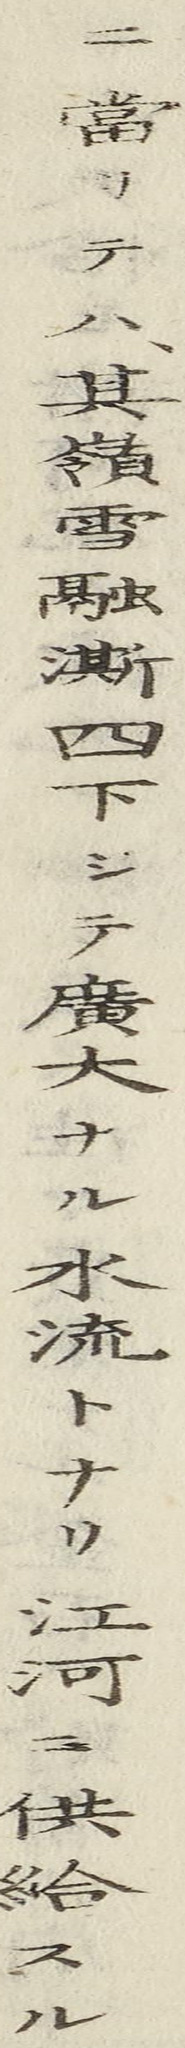ニ当リテハ、其嶺雪融漸四下シテ広大ナル水流トナリ江河ニ供給スル

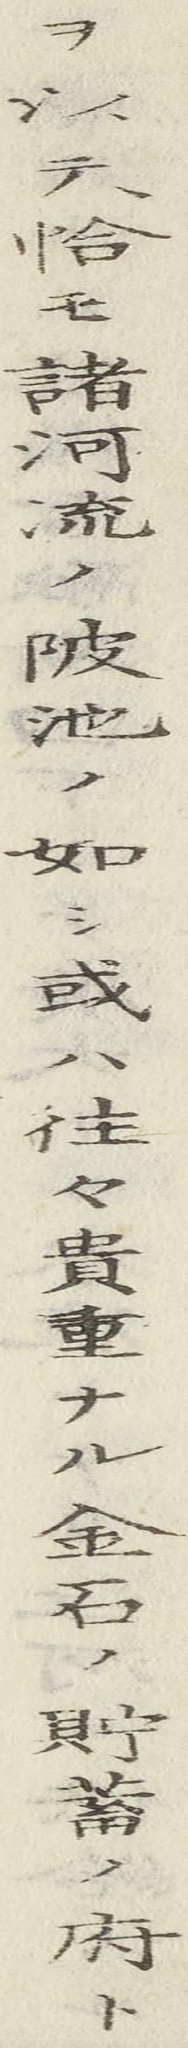ヲ以テ、恰モ諸河流ノ陂池ノ如シ或ハ往々貴重ナル金石ノ貯蓄ノ府ト
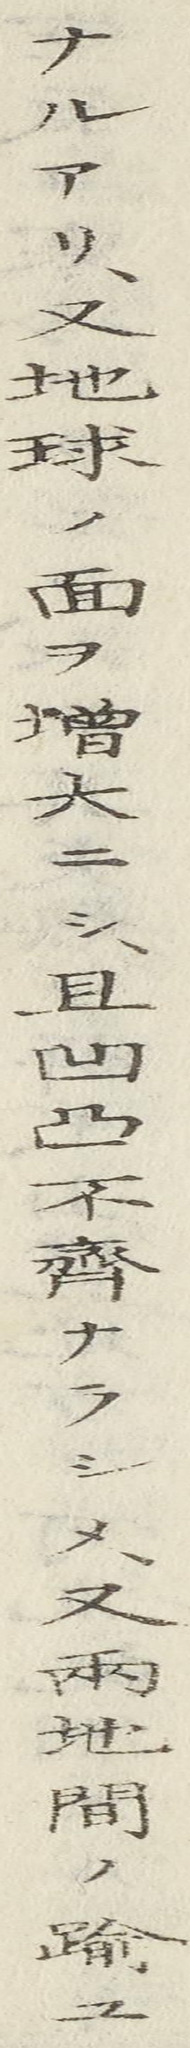ナルアリ、又地球ノ面ヲ増大ニシ、且凹凸不斉ナラシメ、又両地間ノ踰ユ
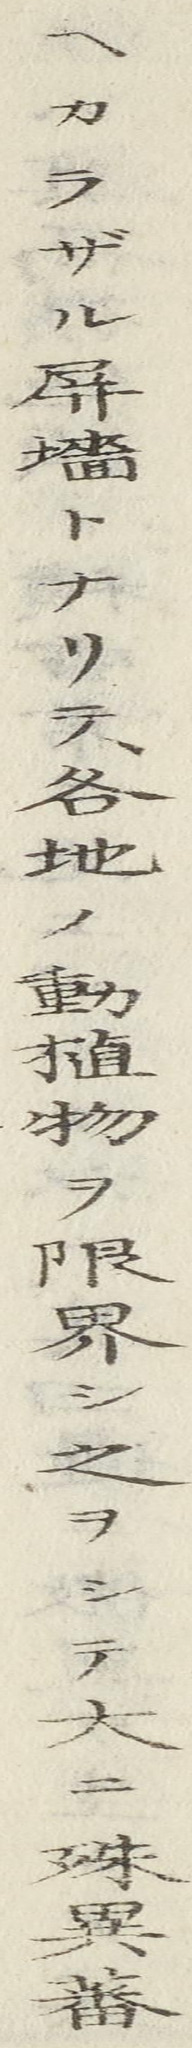ヘカラザル屏墻トナリテ、各地ノ動植物ヲ限界シ之ヲシテ大ニ殊異蕃
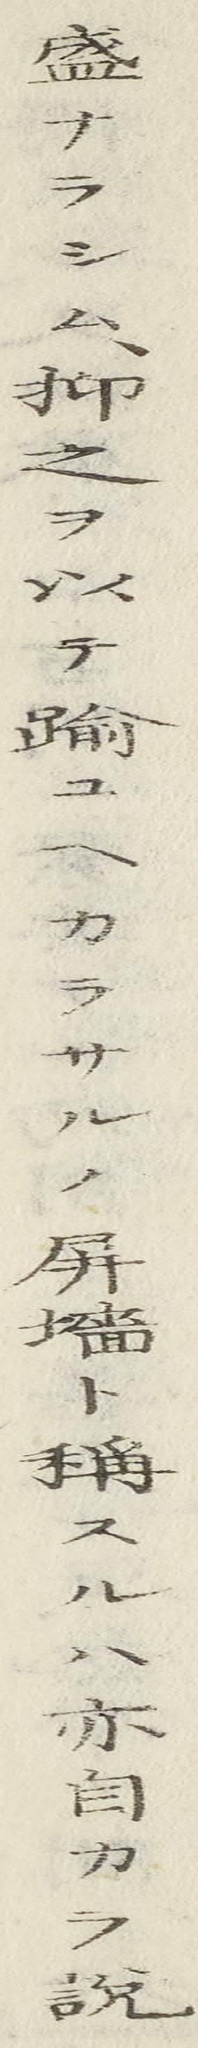盛ナラシム、抑之ヲ以テ踰ユヘカラサルノ屏墻ト称スルハ亦自カラ説
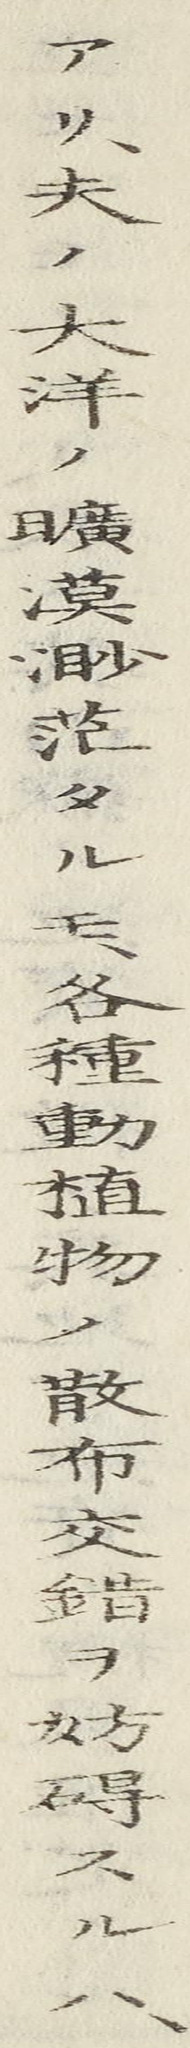アリ、夫ノ大洋ノ曠漠渺范タルモ、各種動植物ノ散布交錯ヲ妨碍スルハ、
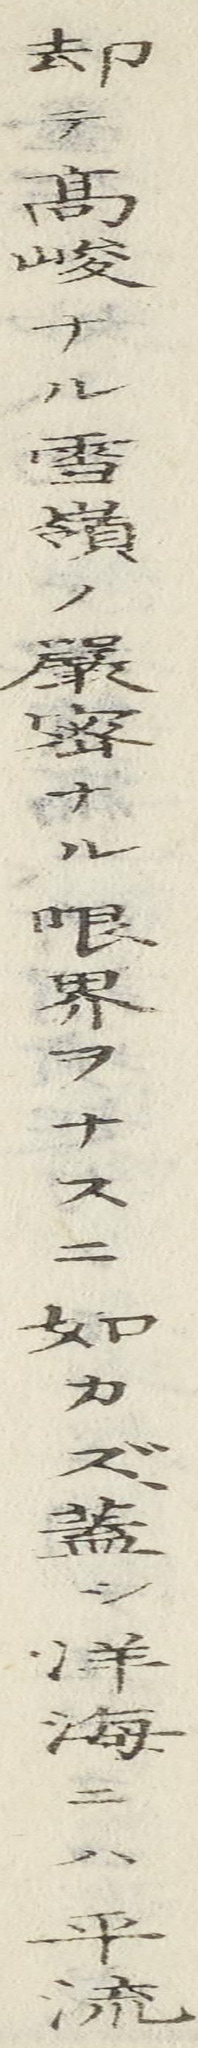却テ高峻ナル雪嶺ノ厳密ナル限界ヲナスニ如カズ、蓋シ洋海ニハ平流
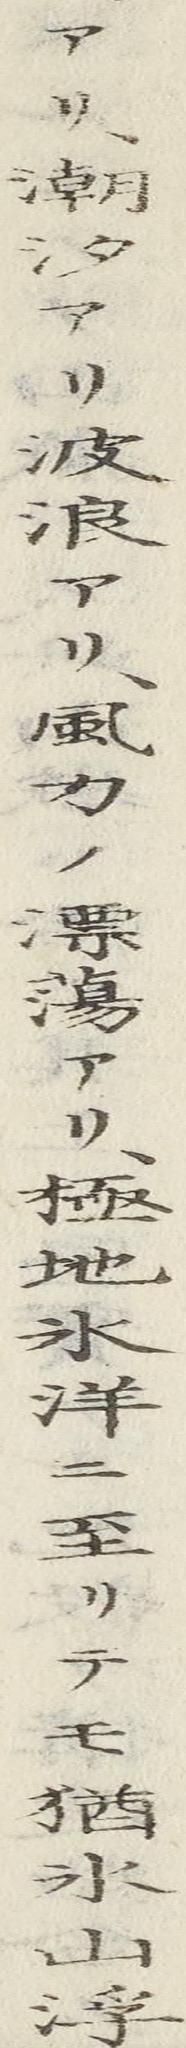アリ、潮汐アリ波浪アリ、風力ノ漂蕩アリ、極地氷洋ニ至リテモ猶氷山浮
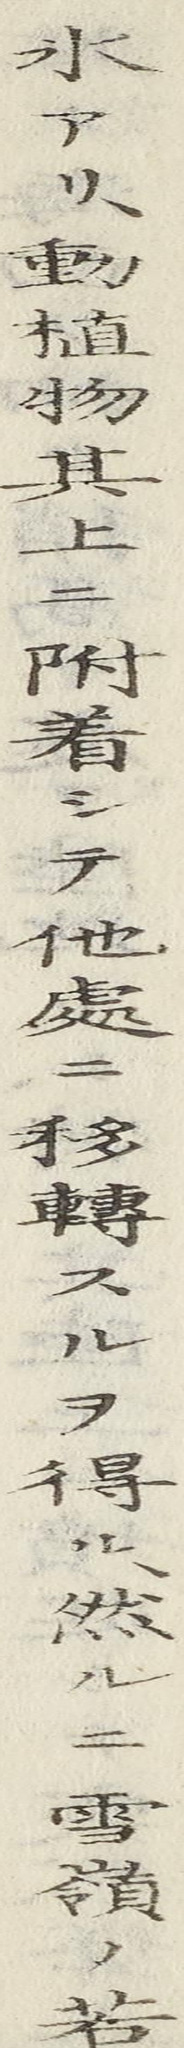氷アリ、動植物其上ニ附着シテ他処ニ移転スルヲ得ル、然ルニ雪嶺ノ若
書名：百科全書　地文學　全
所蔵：東京大学地震研究所図書室 Earthquake Research Institute Library, The University of Tokyo, JAPAN
